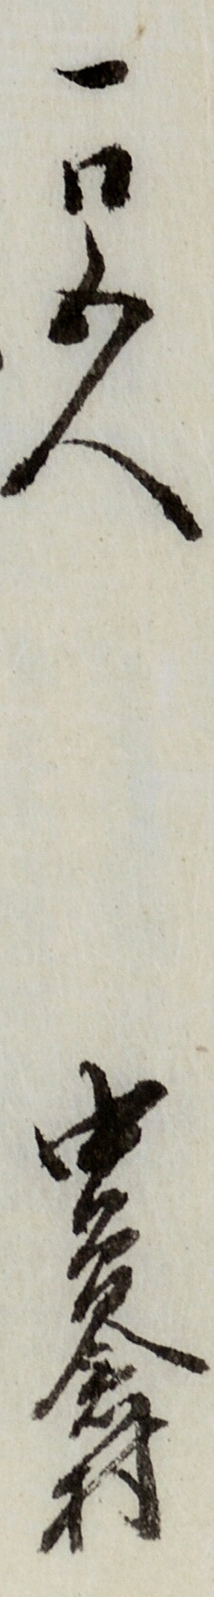一同五人中曾倉村
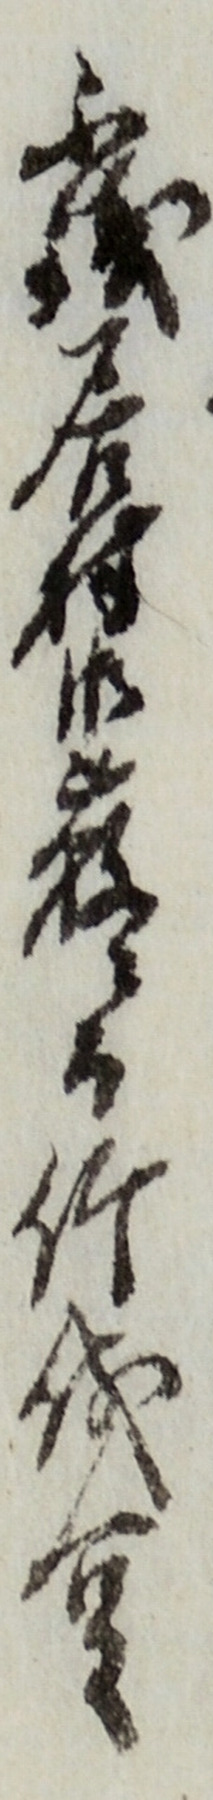不残居村御籔ニ而竹伐人足
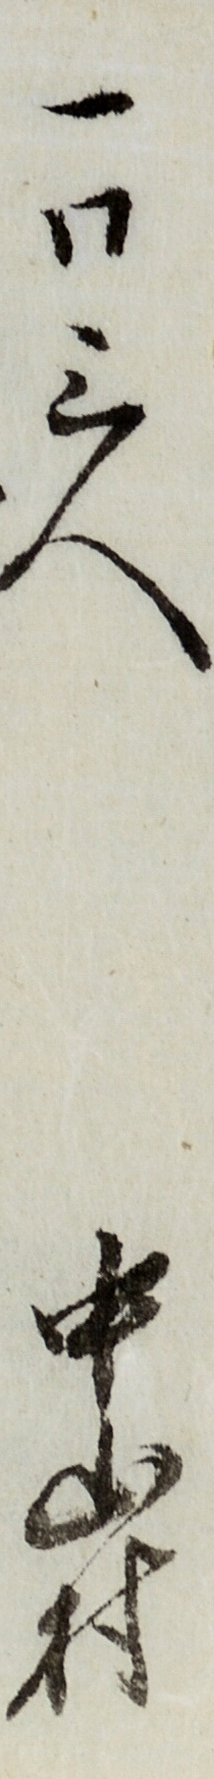一同三人中山村
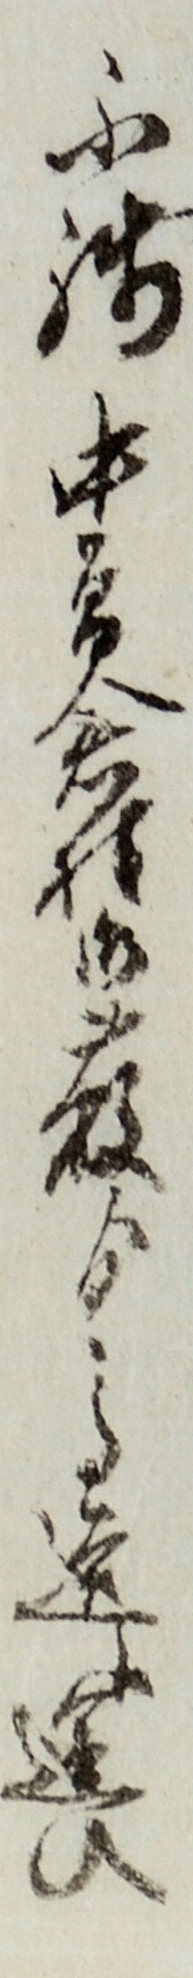不残中曾倉村御籔ゟ高遠江運ひ
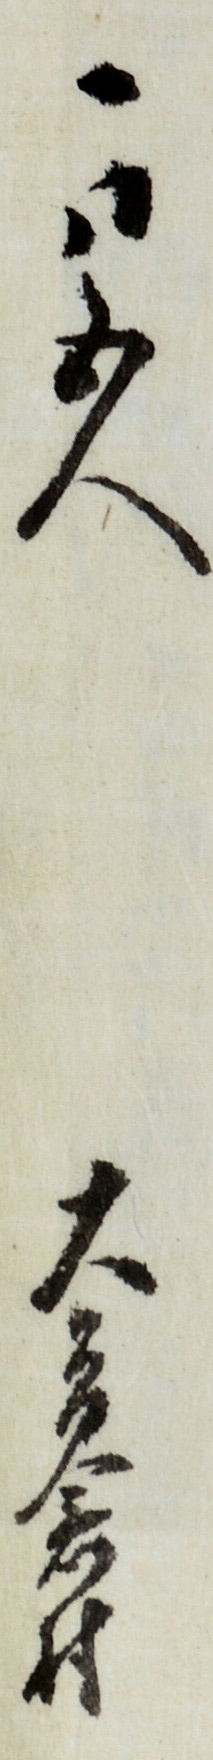一同五人大曾倉村
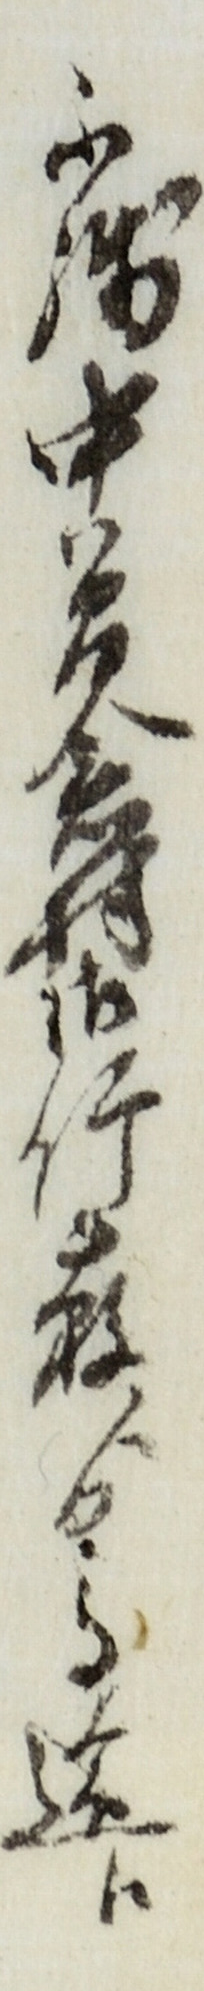不残中曾倉村御竹藪ゟ高遠江
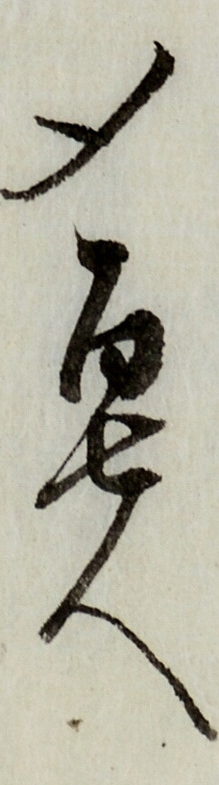〆百七人
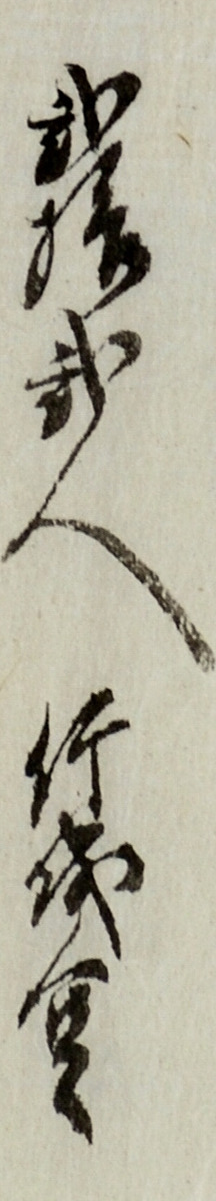弐拾弐人竹伐人足

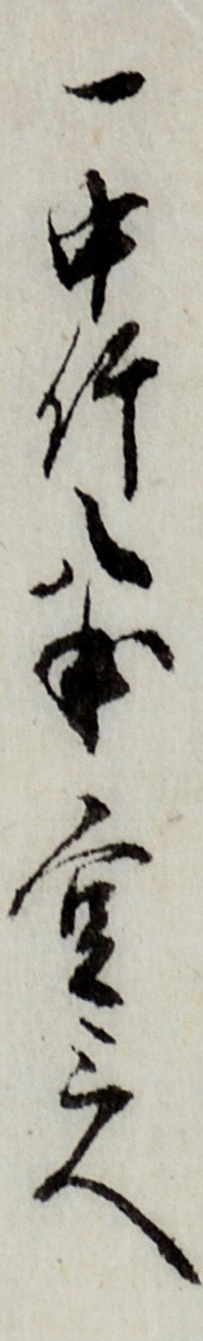一中竹八束八人
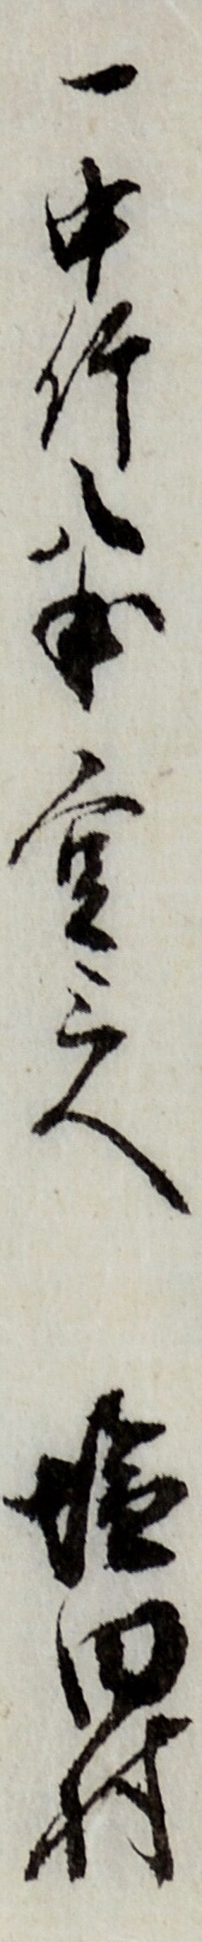一中竹八本人足三人塩田村
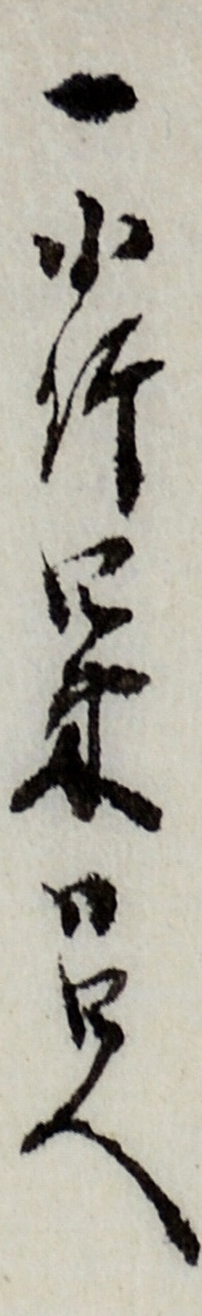一小竹四束同四人
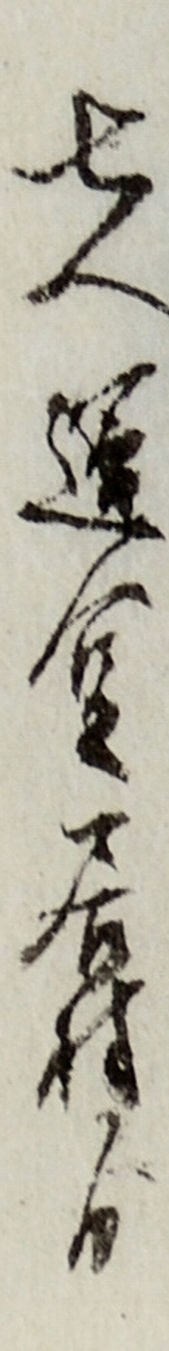七人運人足居村ゟ
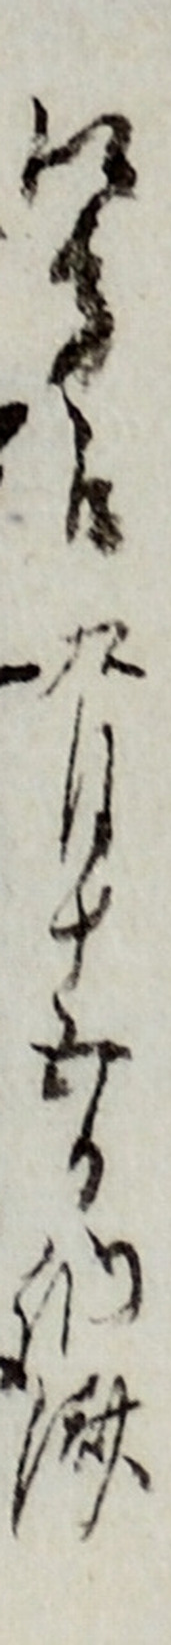作事江九月十五日納済
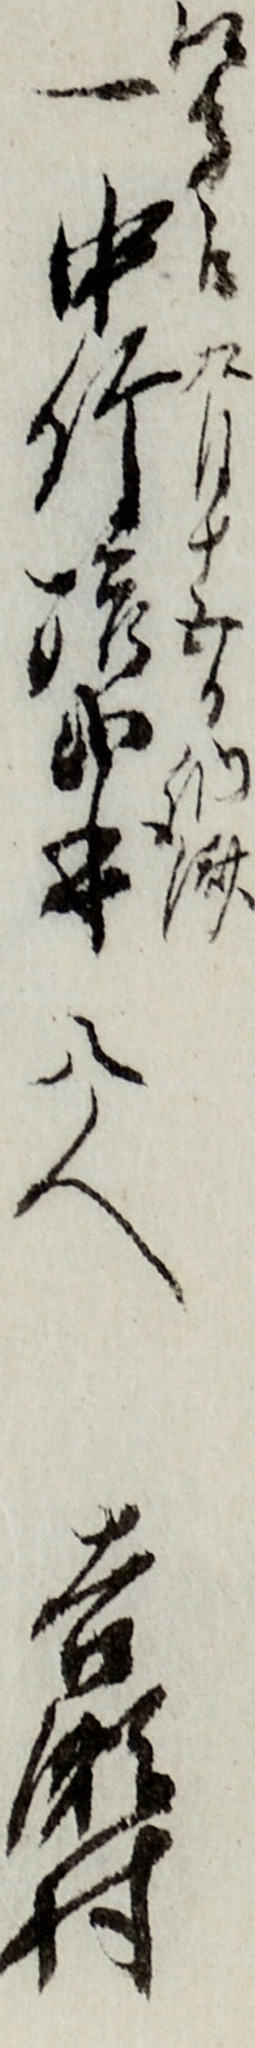一中竹拾弐本八人吉瀬村
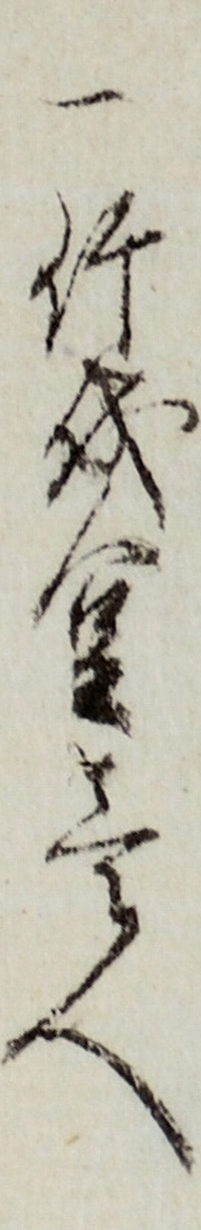一竹伐人足壱人
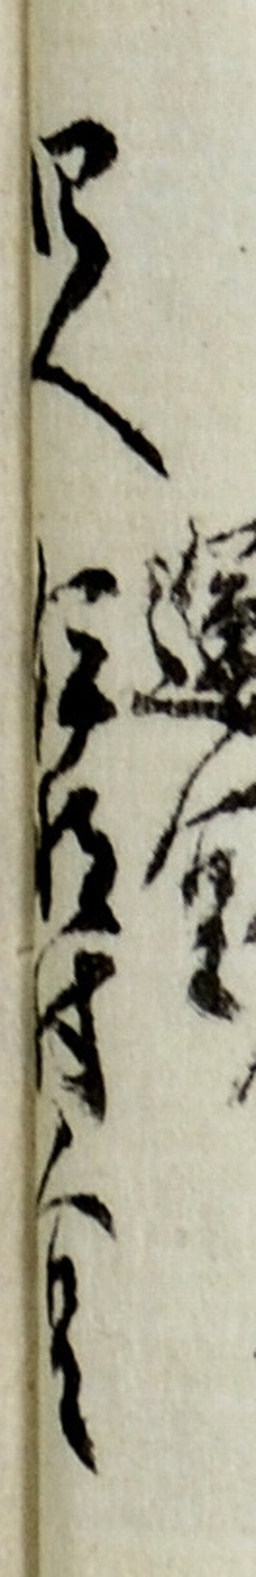四人伊那村人足
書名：中沢郷御竹薮見廻り
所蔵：伊那市立高遠町図書館・合同会社AMANE
